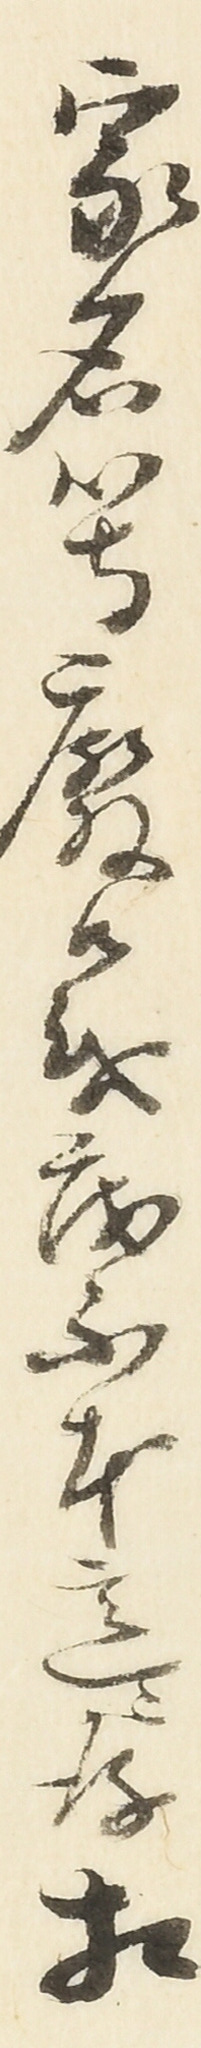家名等廃候義も不本意ニ存相
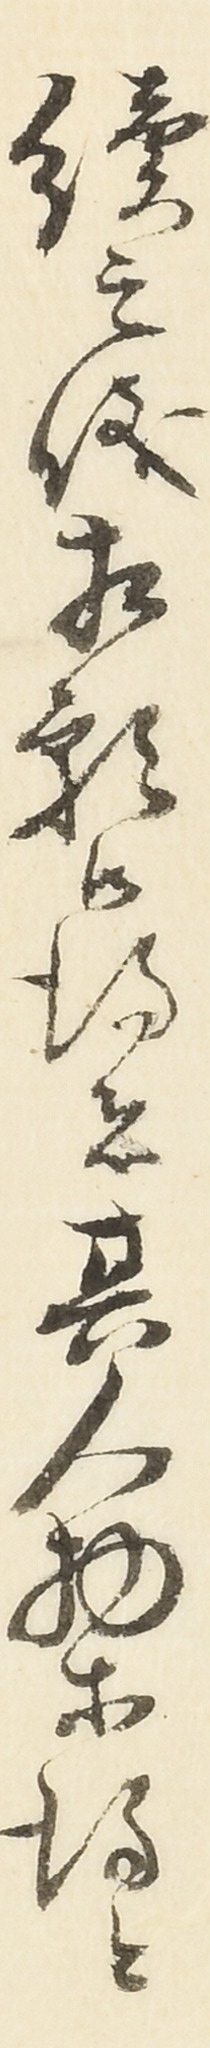続之儀相願候得者其人物等得と
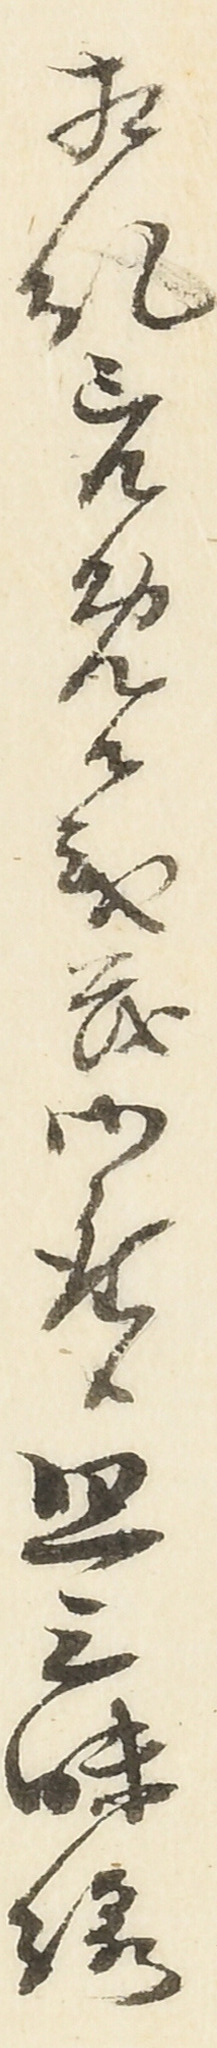相糺差免候義も御座候且三味線
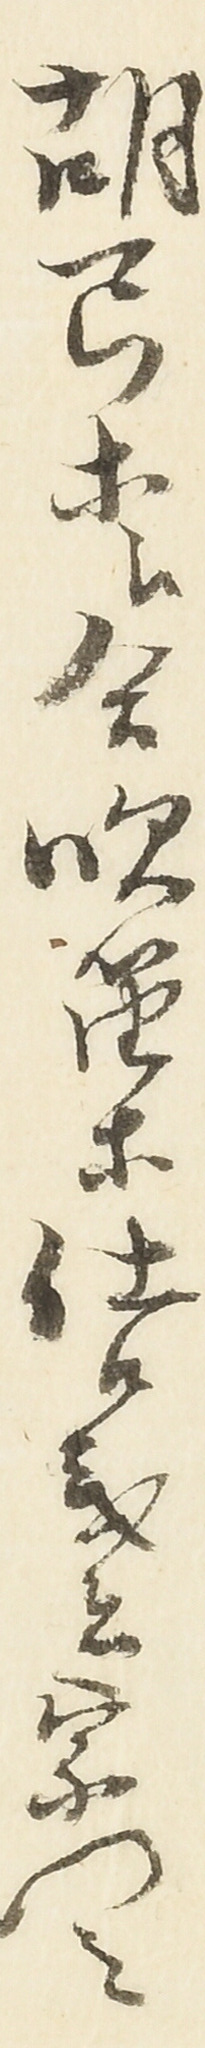胡弓等江合吹笛等仕候義は宗門之
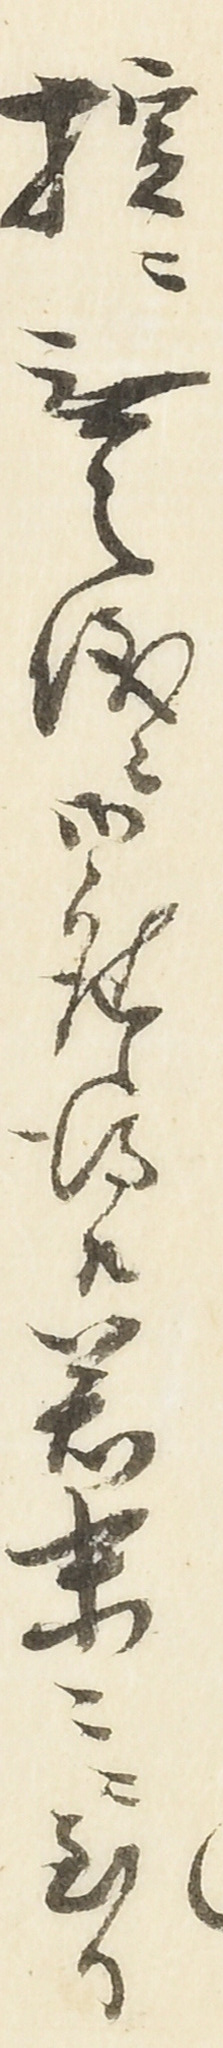掟ニ無之儀に御座候得共若末々ニ至り
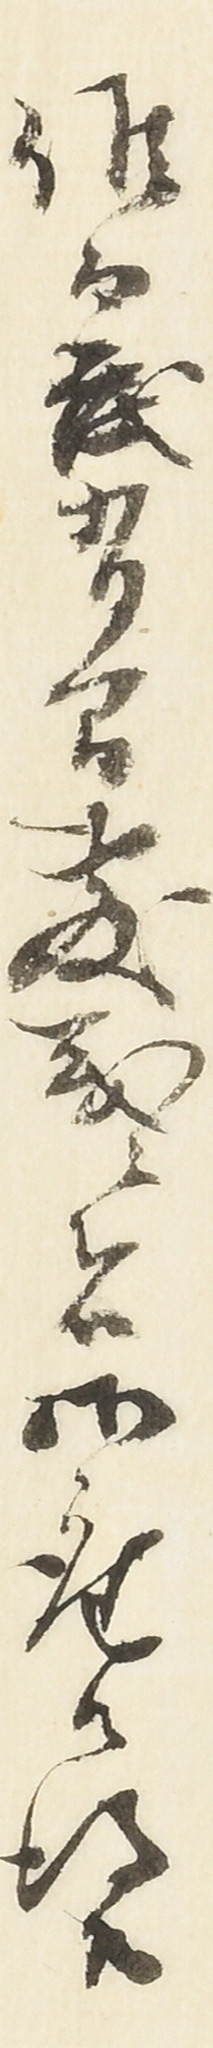候ても有間敷義ニは御座候得共
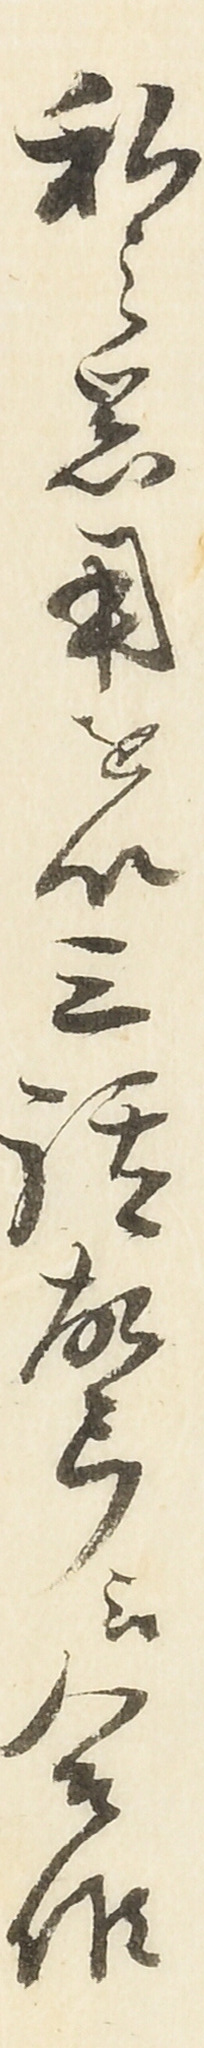私之器用を以三話故弓江合候
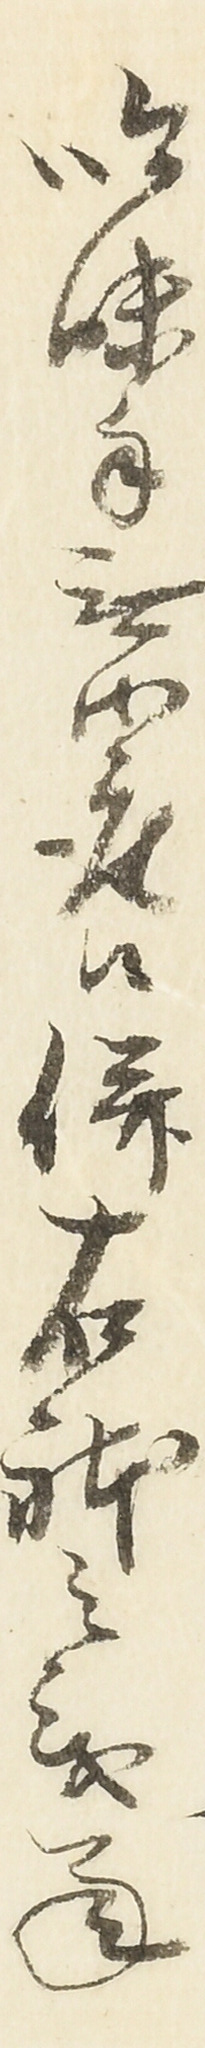吟味手無御座候併右体之義承
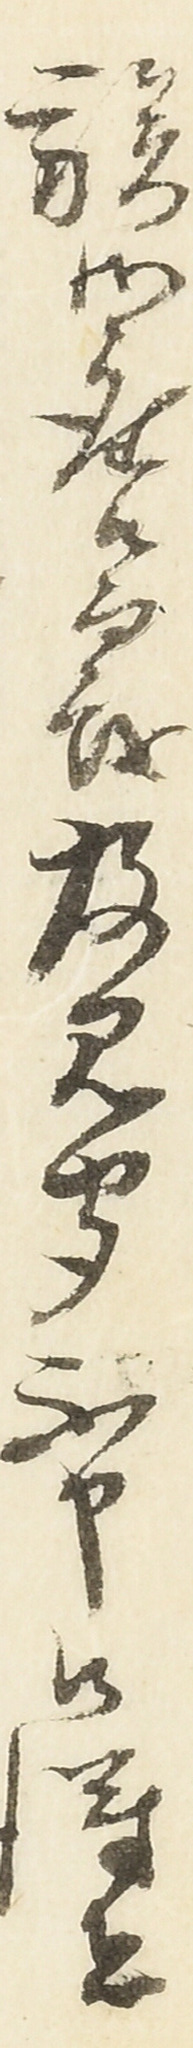族御座候ても及見聞不申候得は
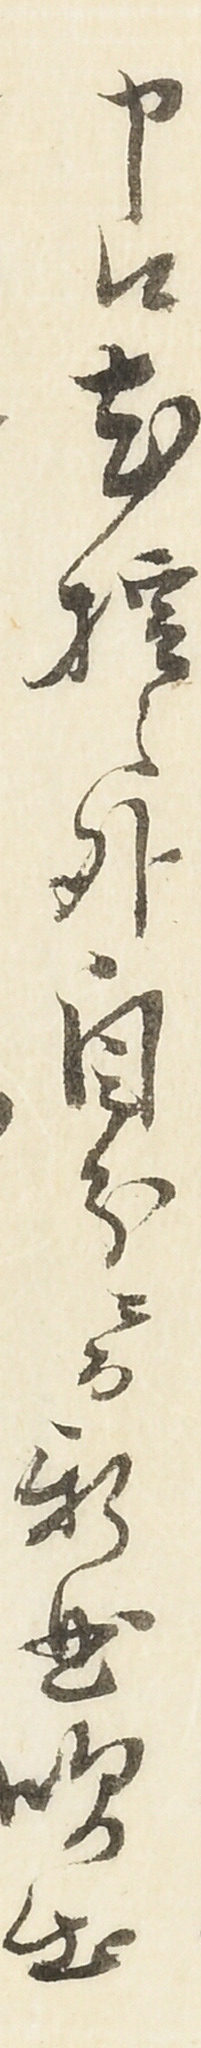申候尤掟之外自分ニ而新曲吹出
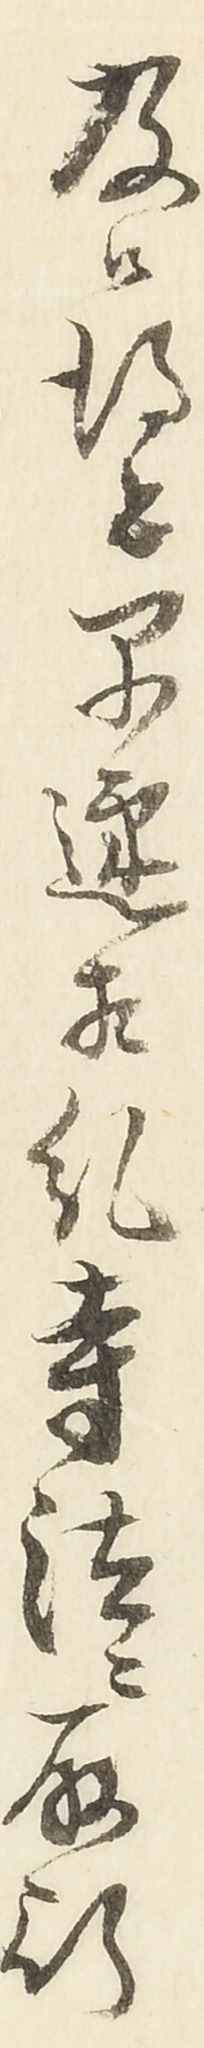及候得は早速相糺寺法に取行
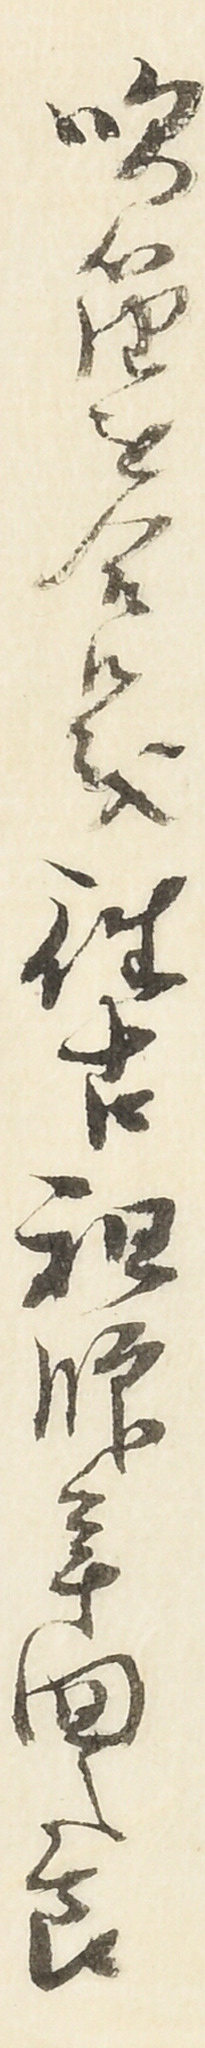吹笛を合候義往古祖師年回之節
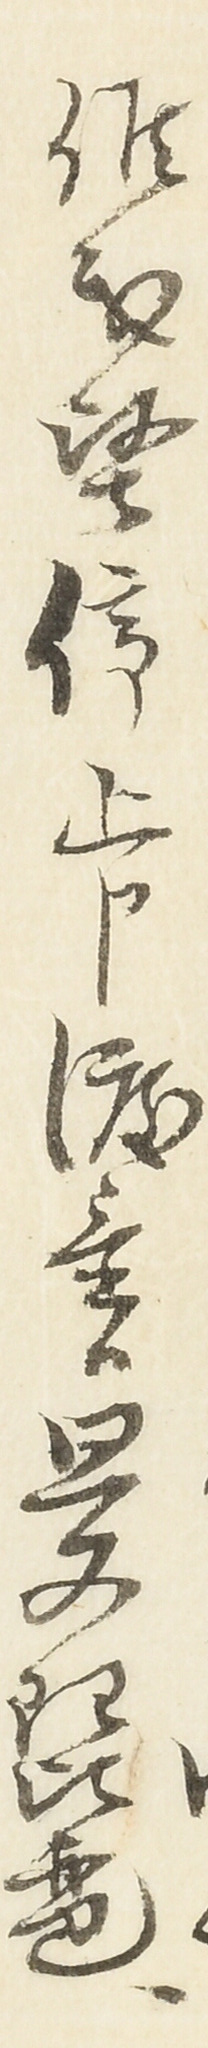候義堅停止申渡置候且又琵琶へ

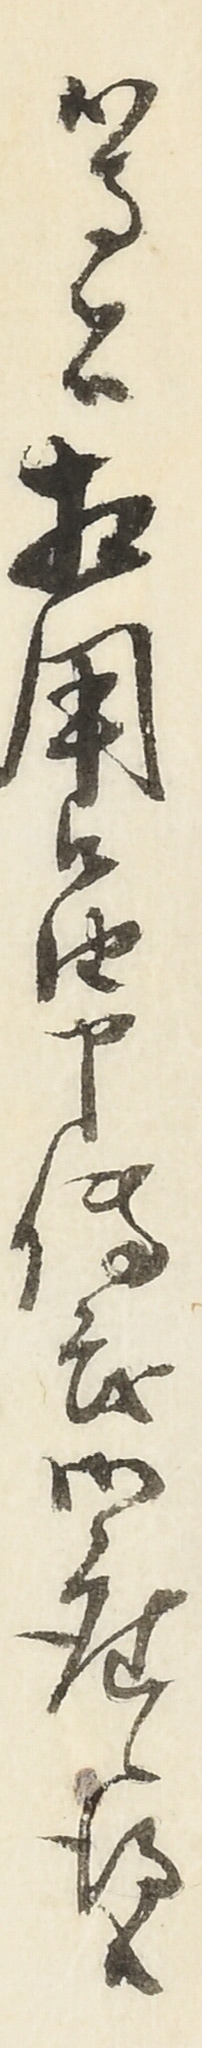等は相用候由申伝も御座候得共
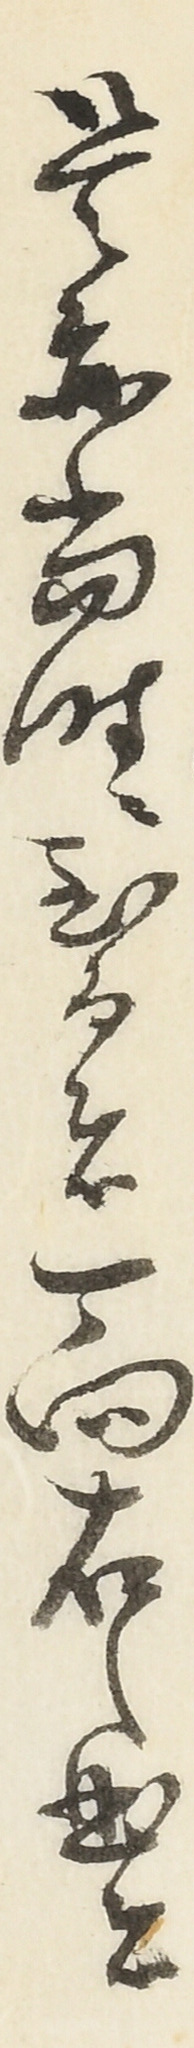是亦当時に至ては一向右之曲は
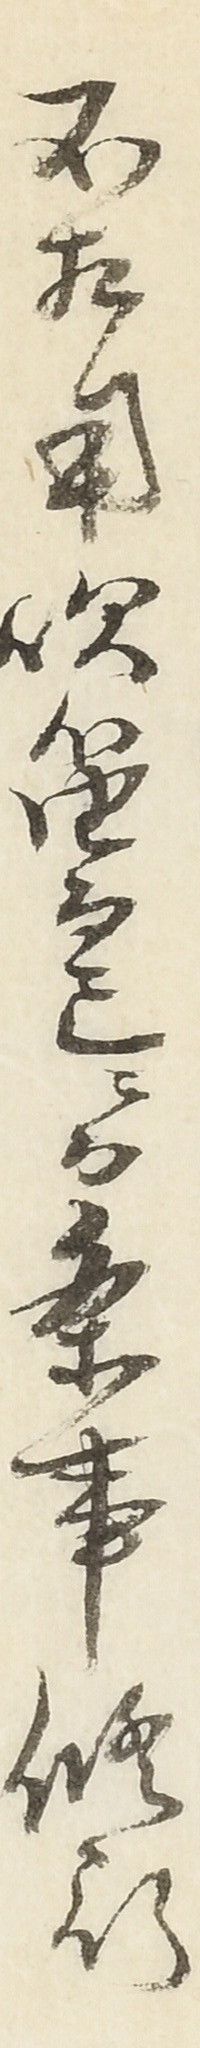不相用吹笛而己ニ而祭事修行
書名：秘書
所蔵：伊那市立高遠町図書館・合同会社AMANE
